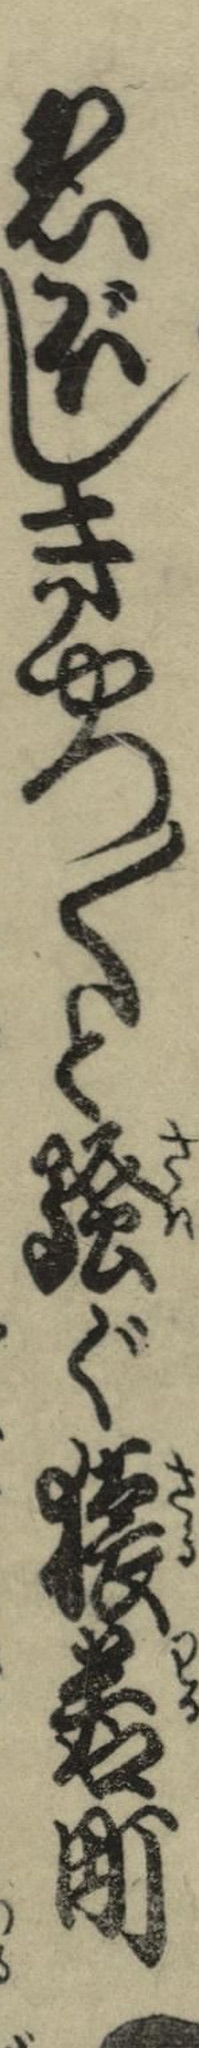のぼしきやつ〳〵と騒ぐ猿若町
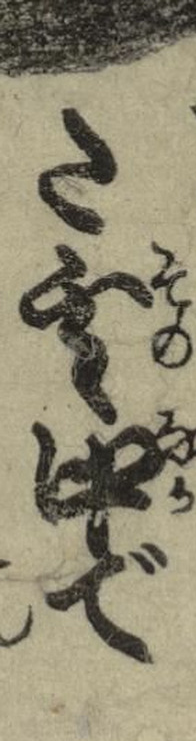た其中で
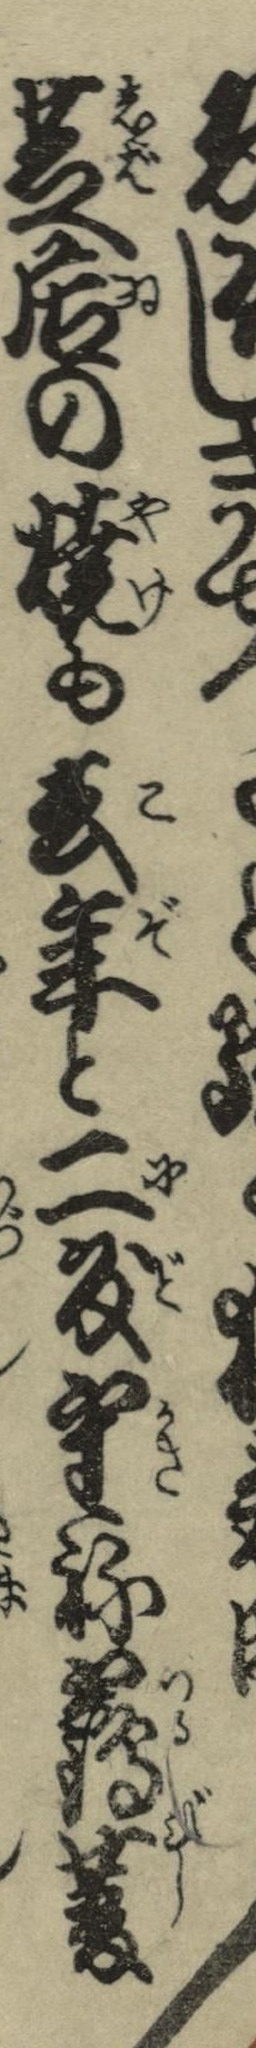芝居の焼も去年と二度重ね鶴菱
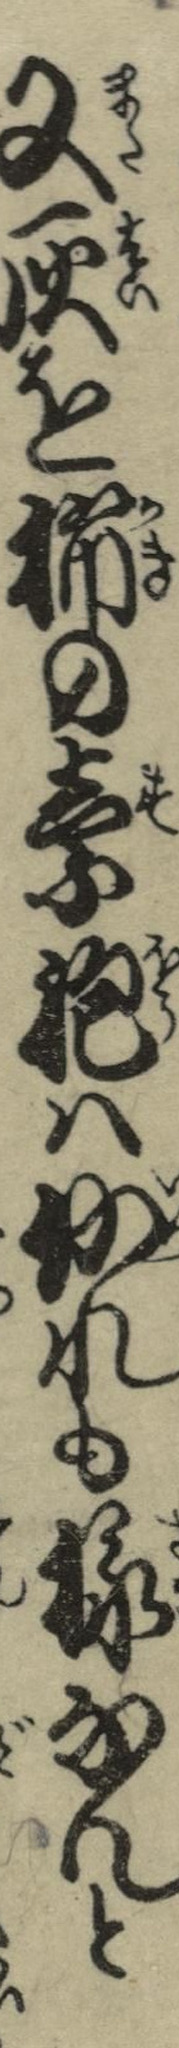又灰を柿の素袍は何れも様なんと
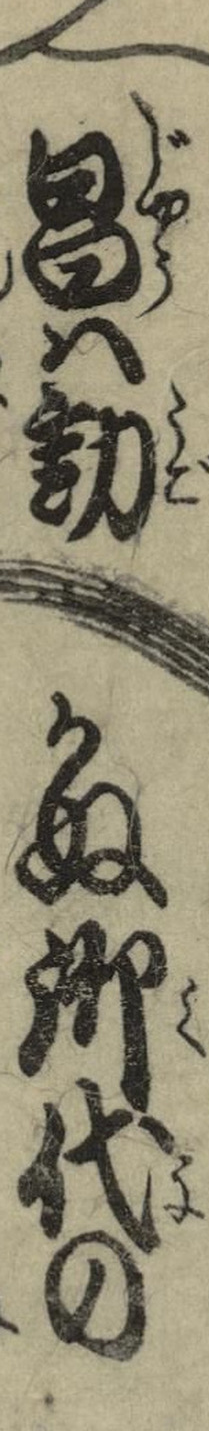昌は動かぬ御代の
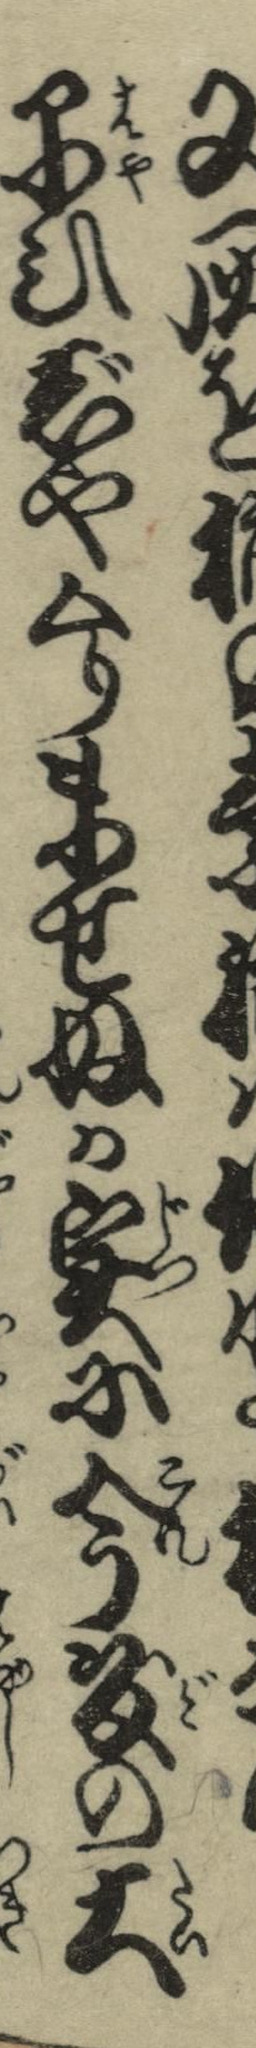早ひじやござりませぬか実に今度の大
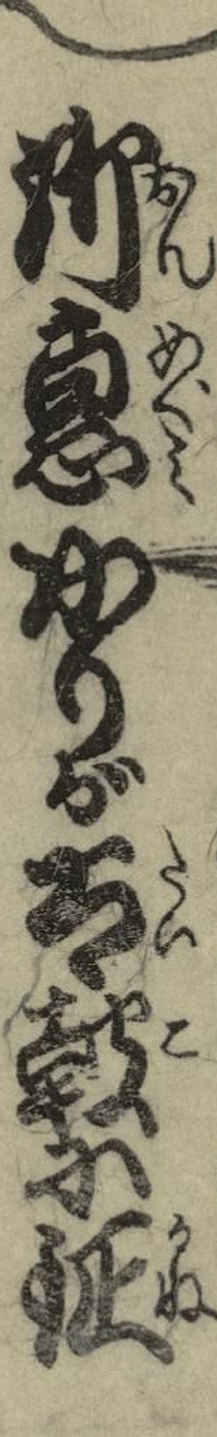御恵ありが太鼓に鉦
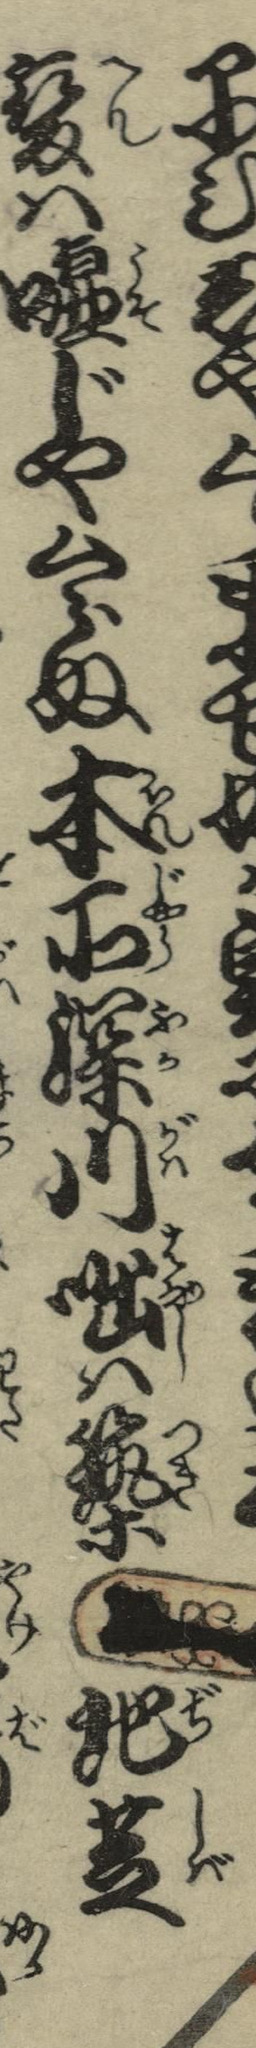変は嘘じやござらぬ本所深川咄は築地芝
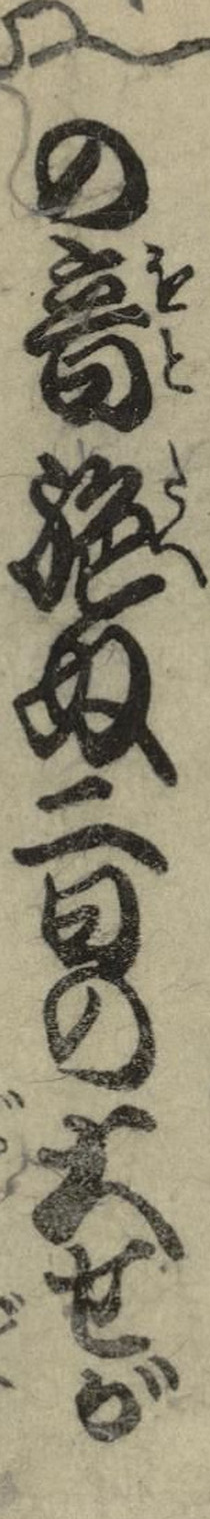の音絶ぬ二日の大せが
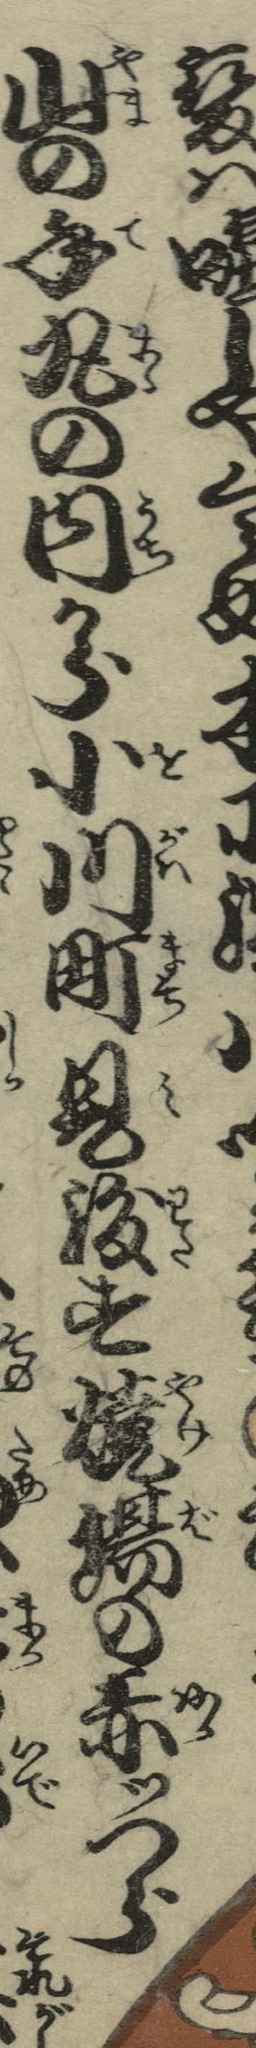山の手丸の内から小川町見渡す焼場の赤ッつら
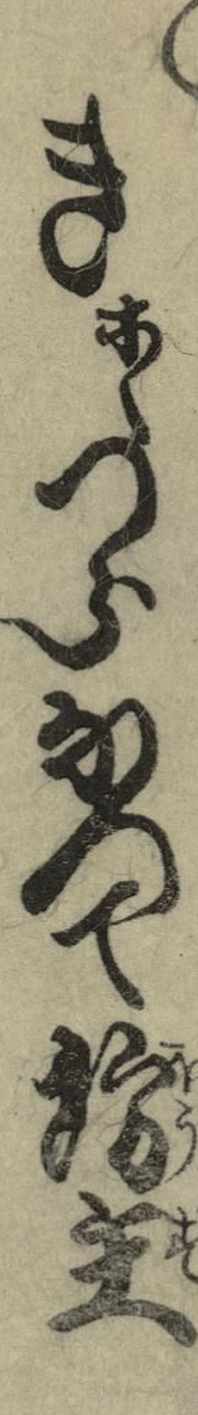き等ヽつらなつて坊主
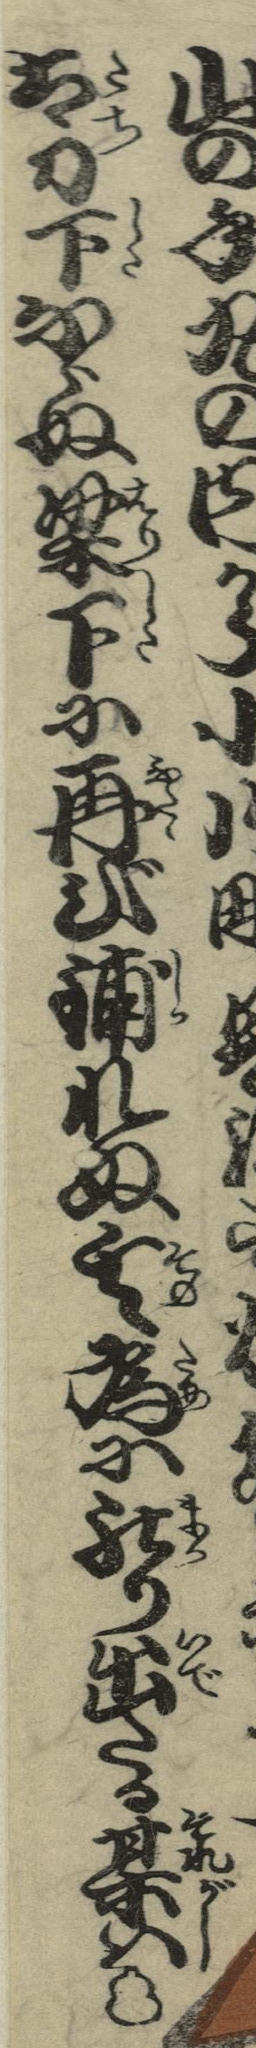太刀下ならぬ梁下に再び鋪れぬ其為に罷り出たる某は
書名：しばらくのそとね
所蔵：東京大学地震研究所図書室 Earthquake Research Institute Library, The University of Tokyo, JAPAN
